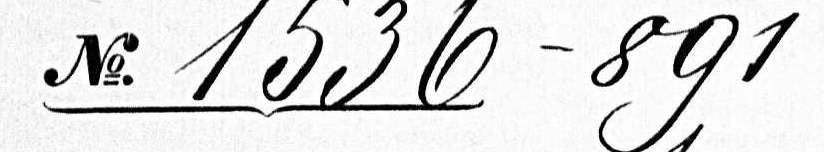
No 1536– 1891
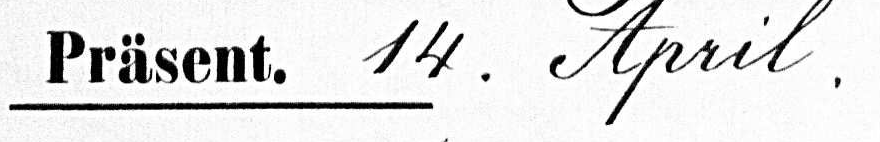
Präsent. – 14. April
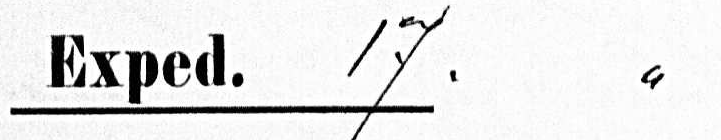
Exped. – 17. „
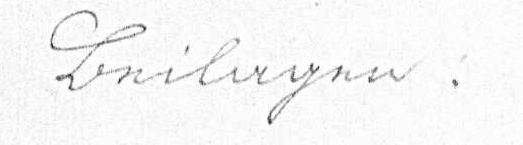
Beilagen
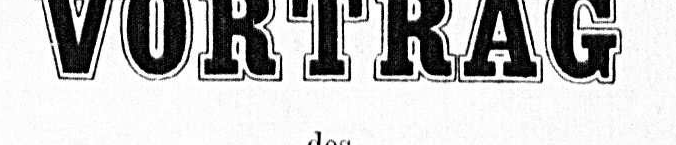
VORTRAG
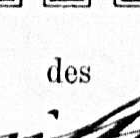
des
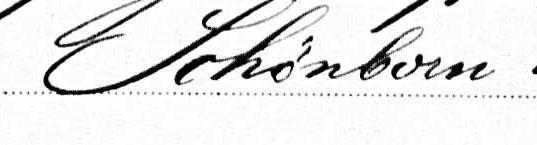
Schönborn
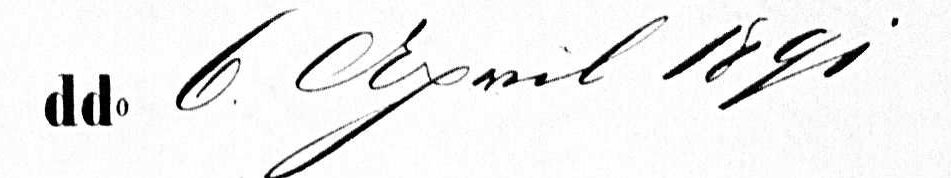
Ddo 6. April 1891
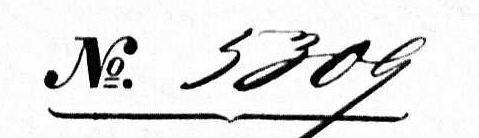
No. 5309
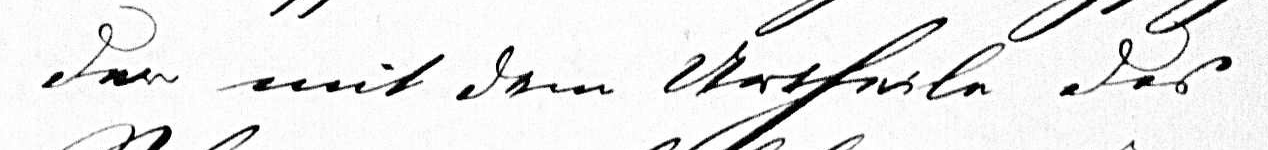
der mit dem Urtheile des
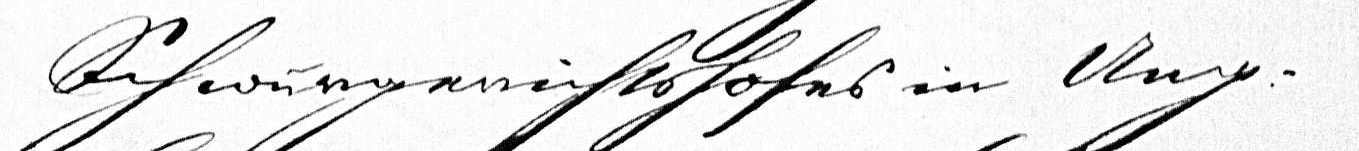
Schwrugerichtshofes in Ung.
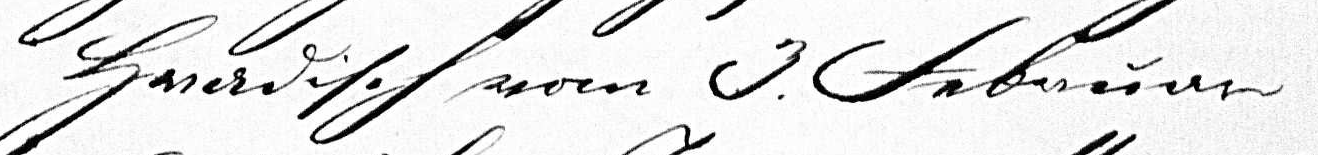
Hradisch vom 3. Februar
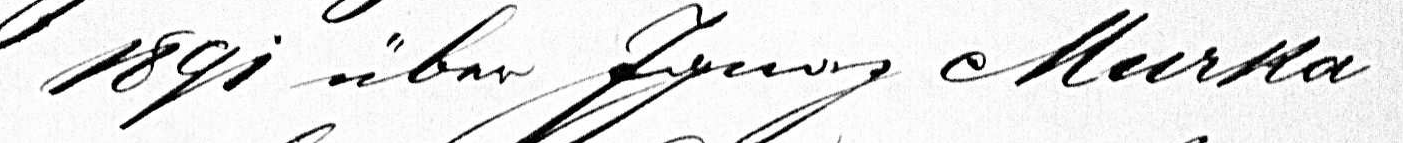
1891 über Ignaz Murka
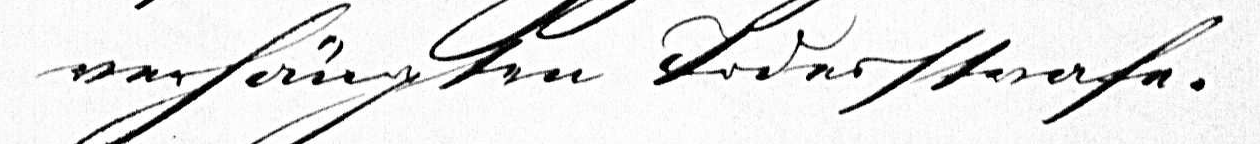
aus Malesitz verhängten Todesstrafe.
